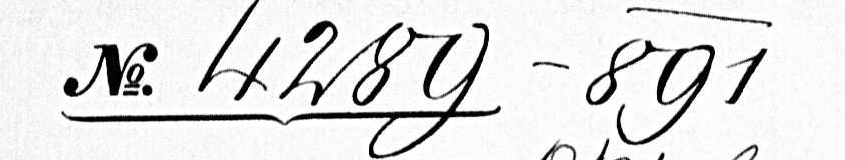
No. 4289 - 1891
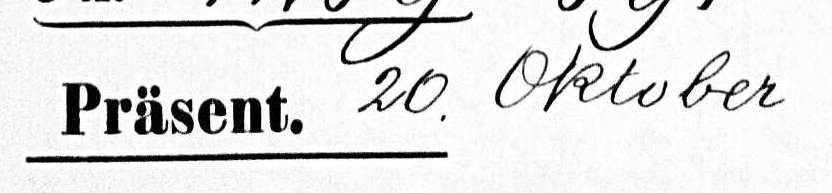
Präsent. 20. Oktober
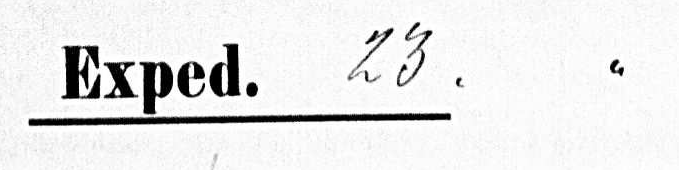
Exped. 23. „
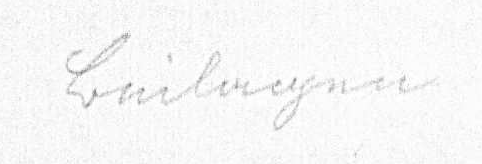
Beilagen
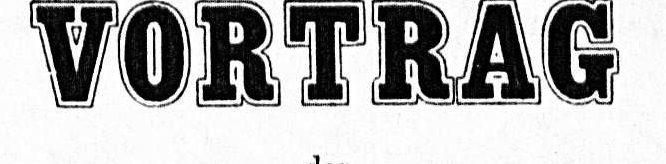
VORTRAG
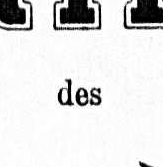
des
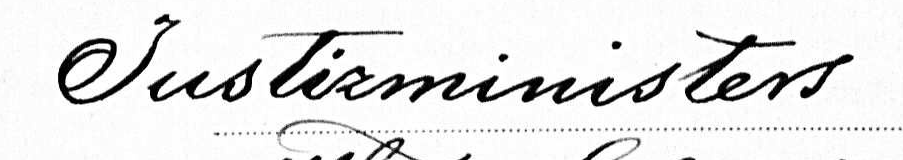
Justizministers
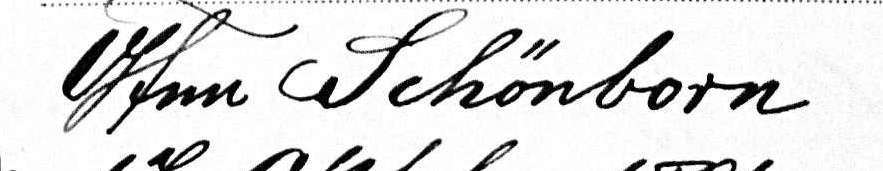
Gfen Schönborn
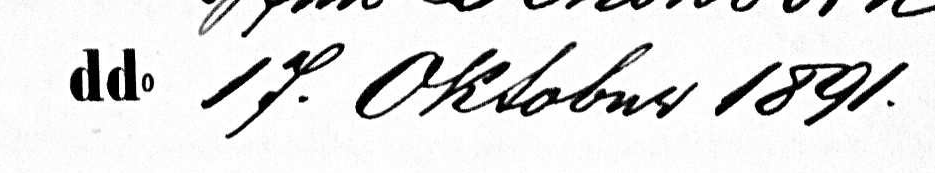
ddo 17. Oktober 1891
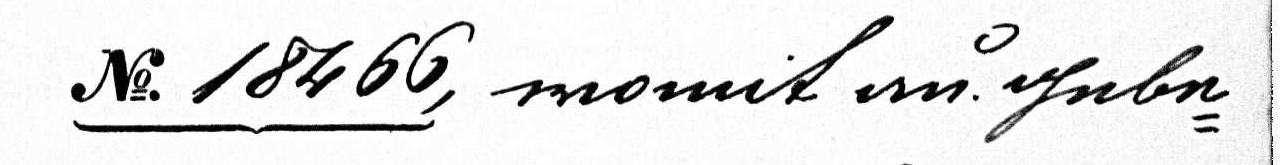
No. 18466 Womit au. Gebe¬
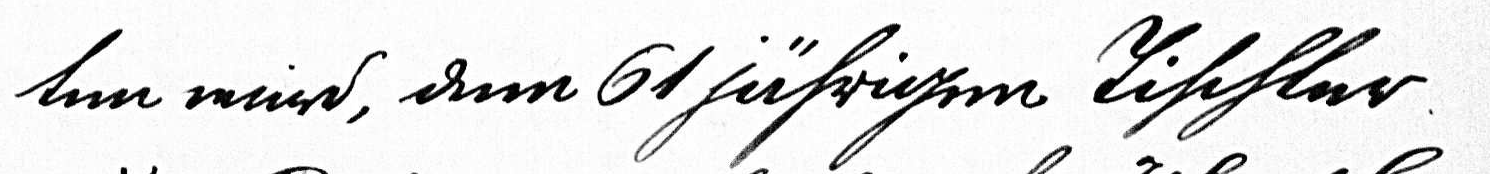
ten wird, den 61jährigen Tischler
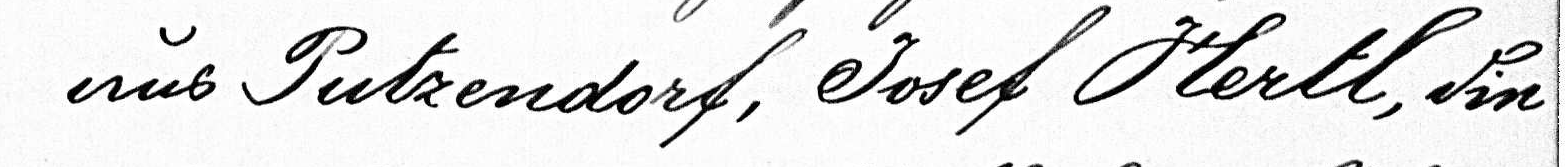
aus Putzendorf, Josef Hertl, die
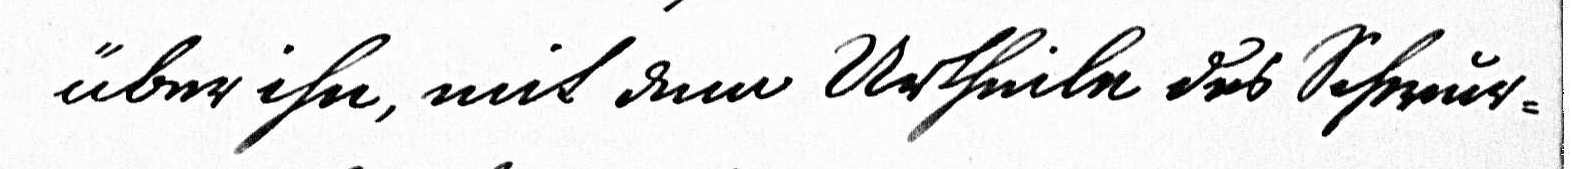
über mit dem Urtheile des Schwur¬
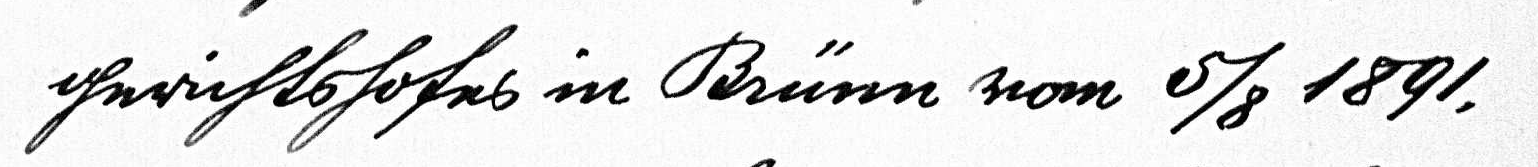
gerichtshofes in Brünn vom 5/8/1891
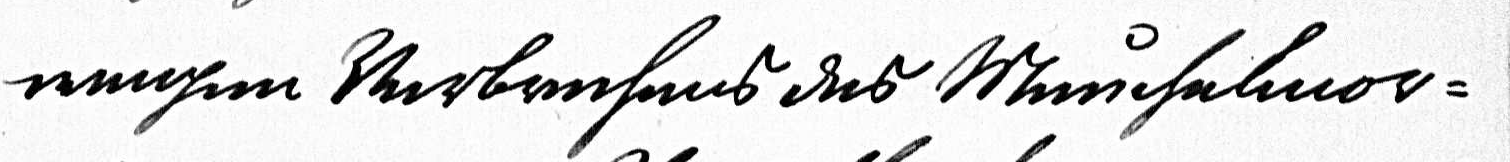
wegen Verbrechens des Meuchelmor¬
